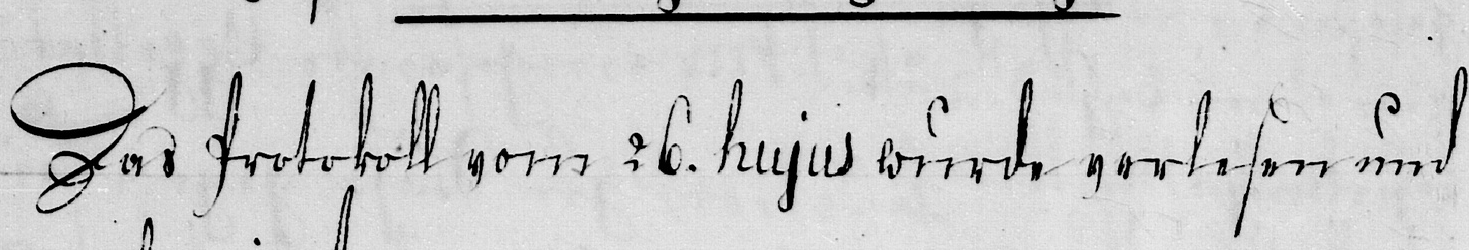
Das Protokoll vom 26. hujus wurde verlesen und
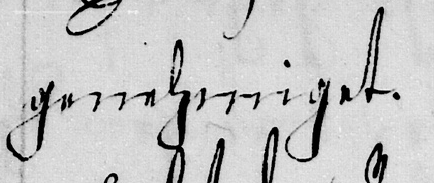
genehmiget.
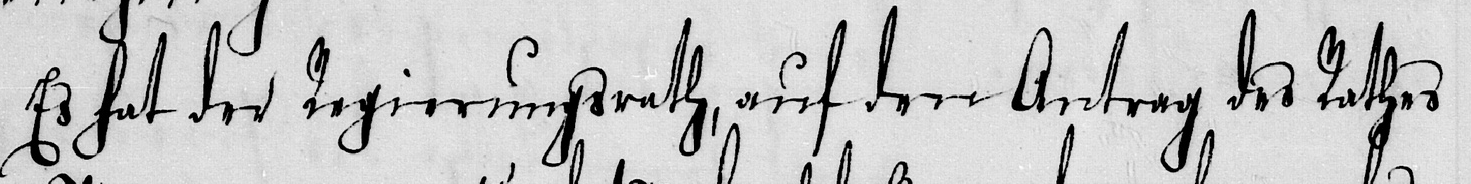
Es hat der Regierungsrath auf den Antrag des Rathes
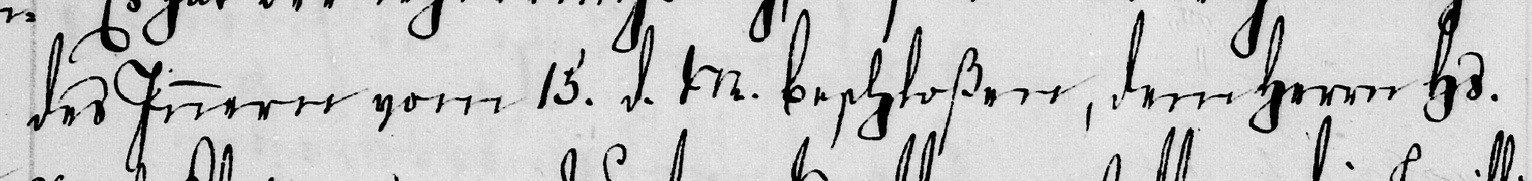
des Innern vom 15. d. M. beschloßen, dem Herrn Hs.
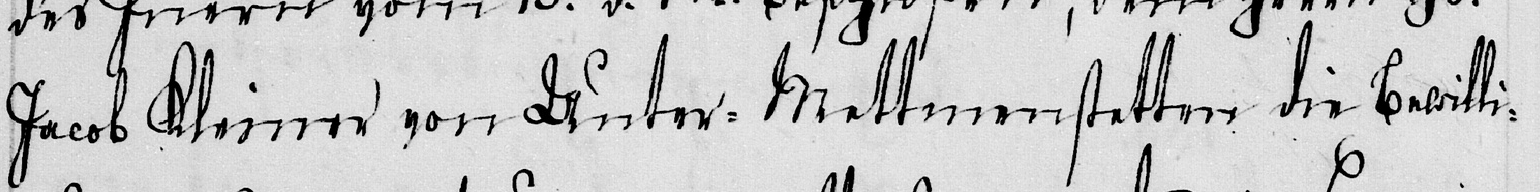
Jacob Kleiner von Unter-Mettmenstetten die Bewill¬
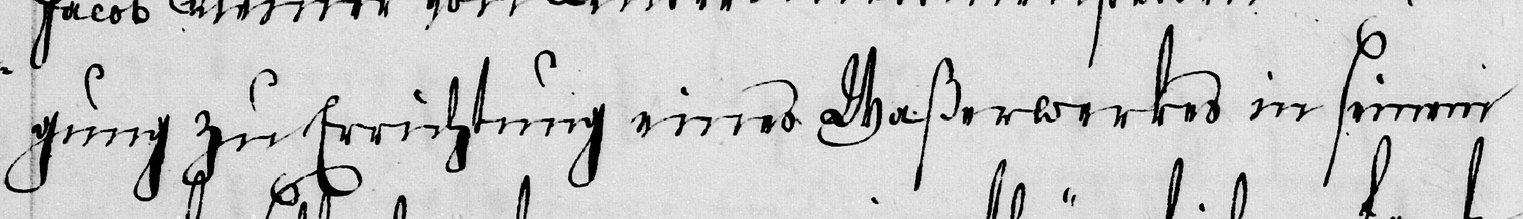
igung zu Errichtung eines Waßerwerkes in seinem
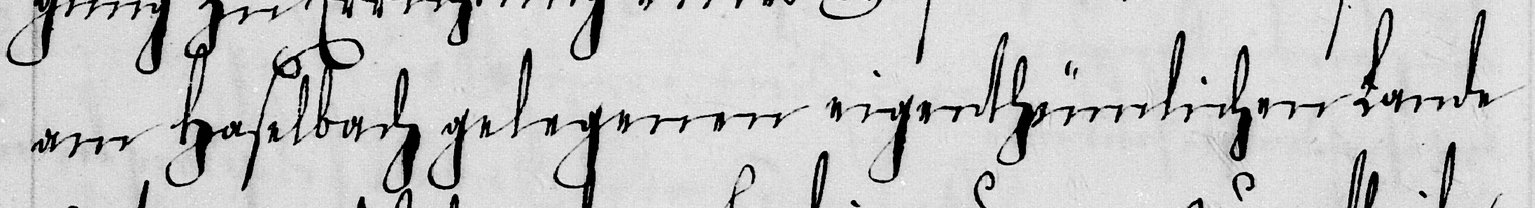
am Haselbach gelegenen eigenthümlichen Lande
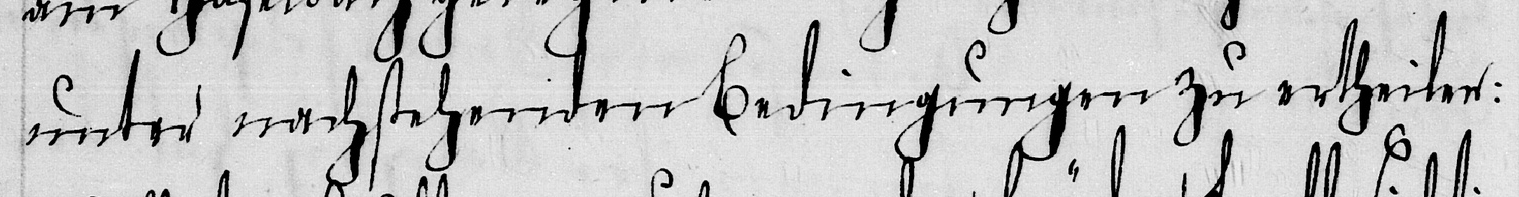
unter nachstehenden Bedingungen zu ertheilen:
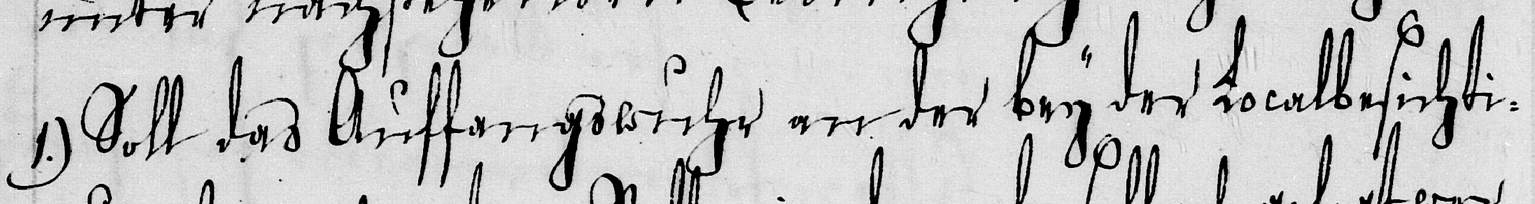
1.) Soll das Auffangswuhr an der bey der Localbesichti¬
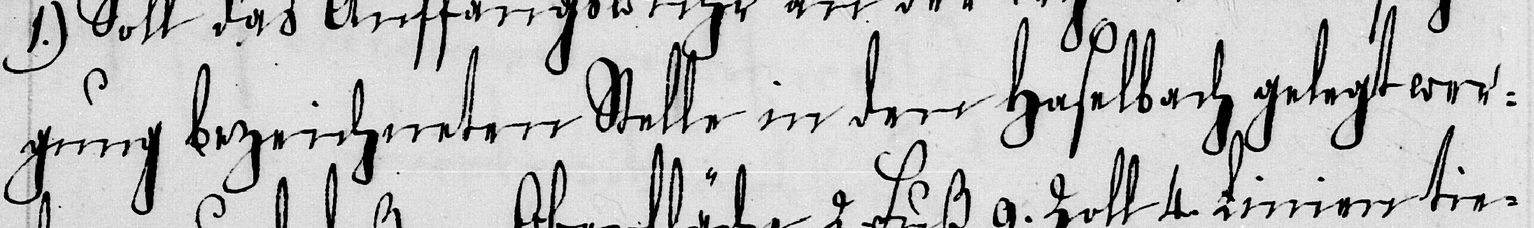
gung bezeichneten Stelle in den Haselbach gelegt wer¬
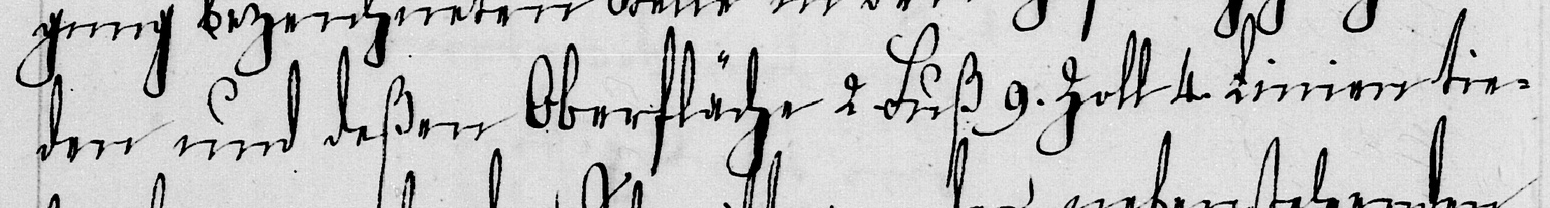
den und deßen Oberfläche 2 Fuß 9. Zoll 4. Linien tie¬
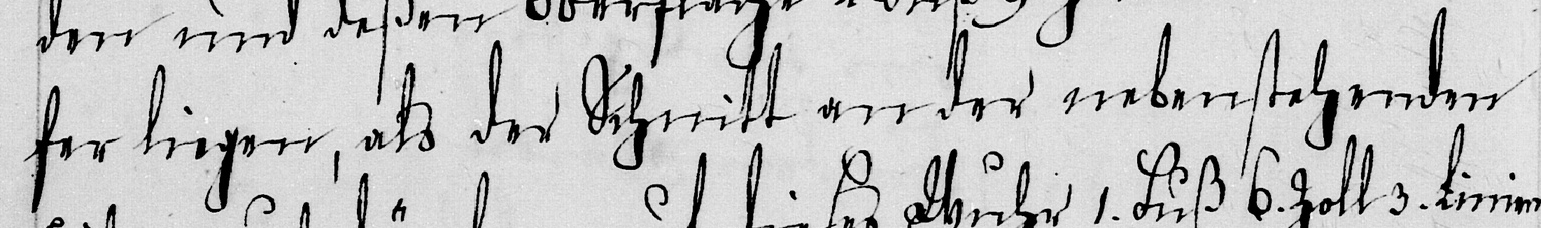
fer liegen, als der Schnitt an der nebenstehenden
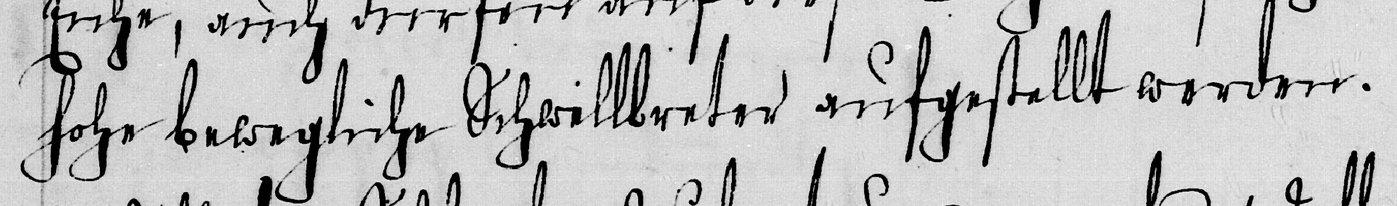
hohe bewegliche Schwellbreter aufgestellt werden.
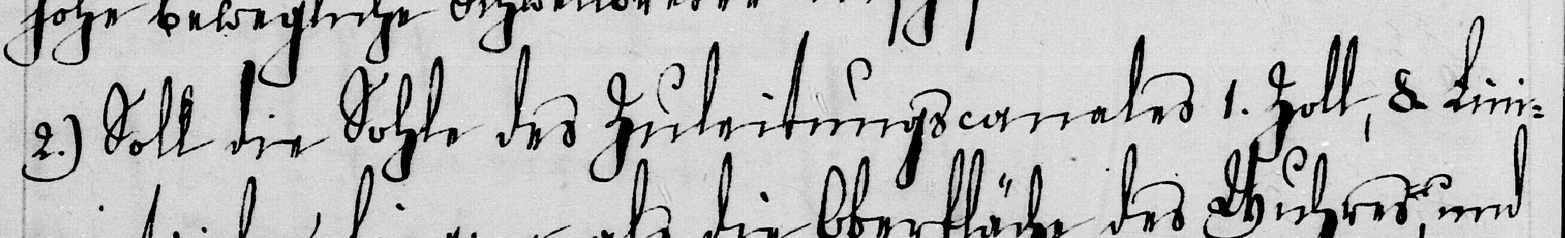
2.) Soll die Sohle des Zuleitungscanales 1. Zoll, 8. Lin¬
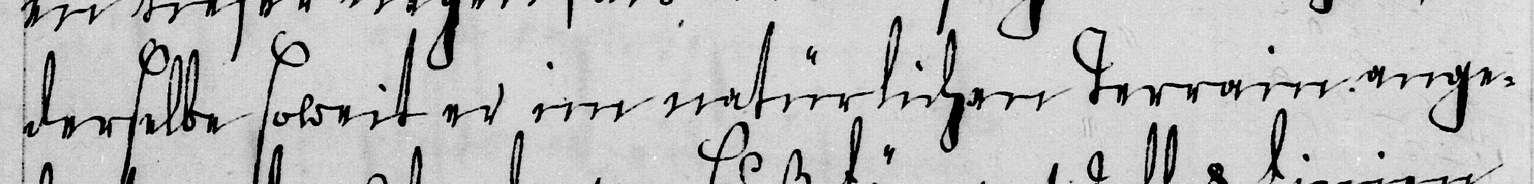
derselbe soweit er im natürlichen Terrain ange¬
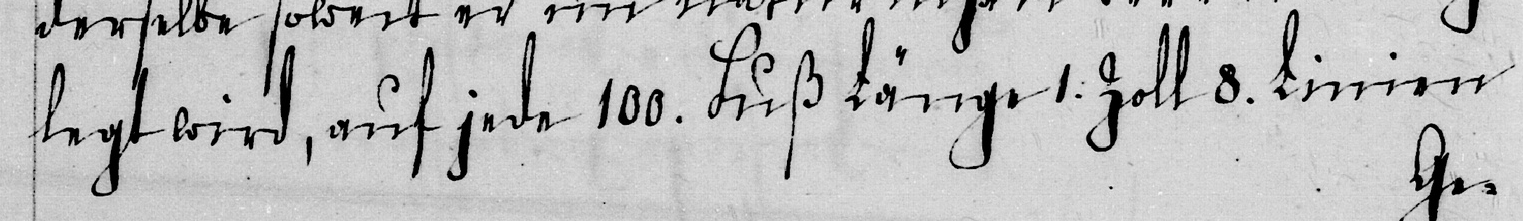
legt wird, auf jede 100. Fuß Länge 1. Zoll 8. Linien
